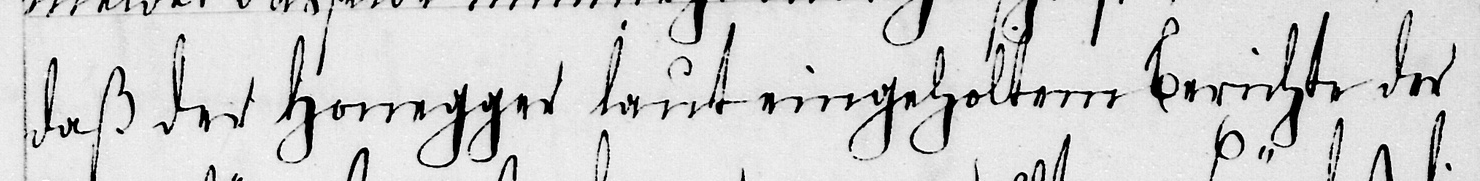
daß der Honegger laut eingeholtem Berichte der
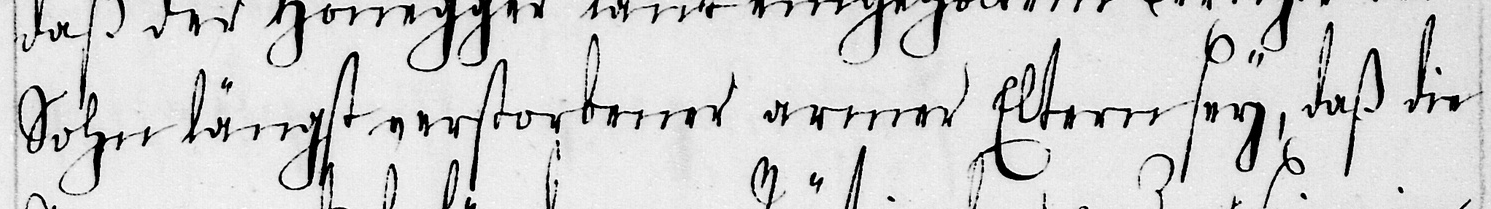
Sohn längst verstorbener armer Eltern sey, daß die
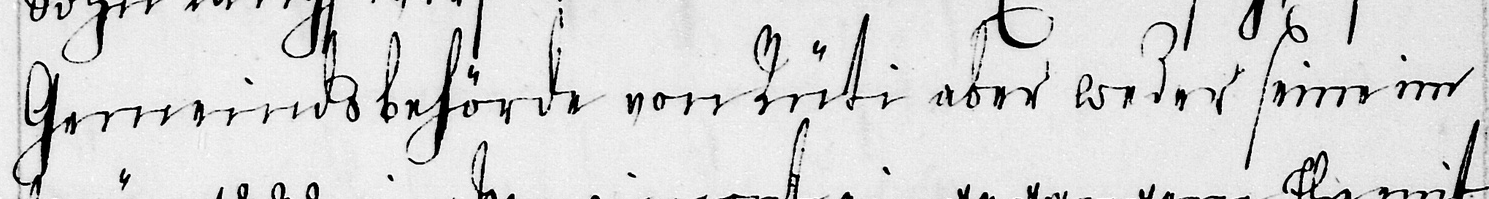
Gemeindsbehörde von Rüti aber weder seine im
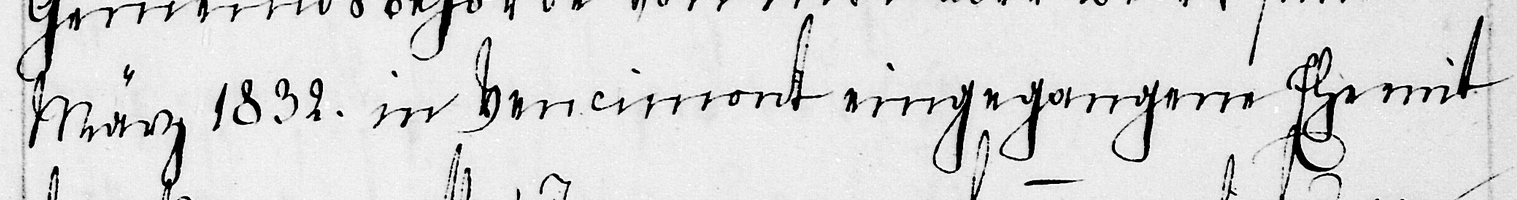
März 1832. in Vencimont eingegangene Ehe mit
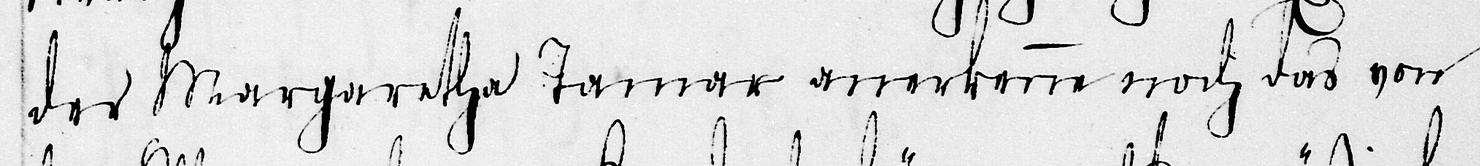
der Margaretha Tamar [sic!] anerkenne noch das von
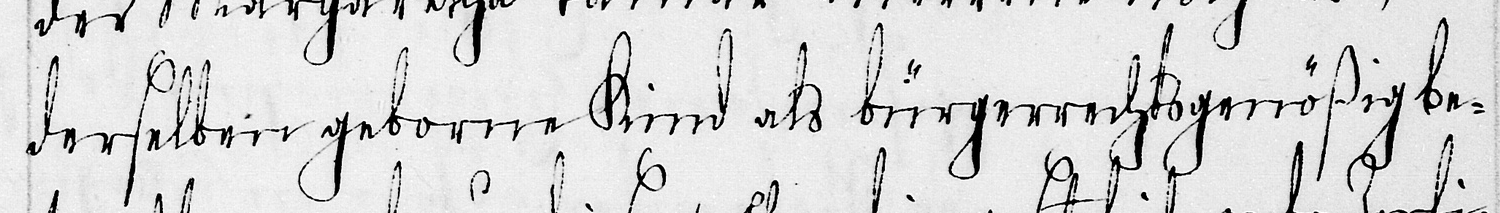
derselben geborne Kind als bürgerrechtsgenößig be¬
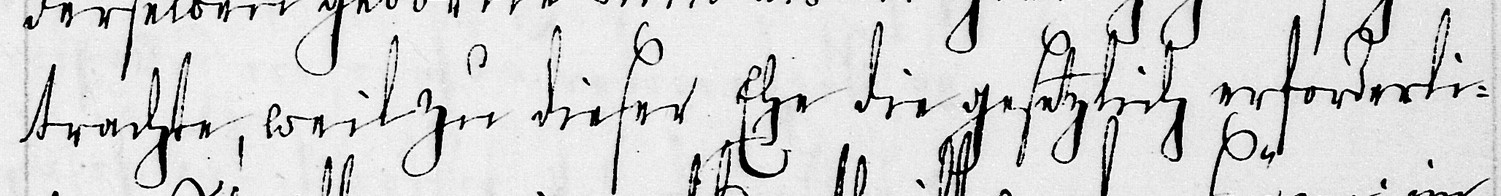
trachte, weil zu dieser Ehe die gesetzlich erforderli¬
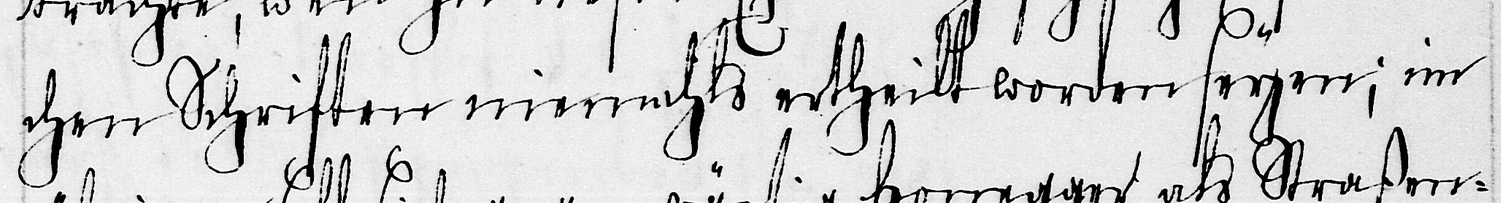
chen Schriften niemahls ertheilt worden seyen; im
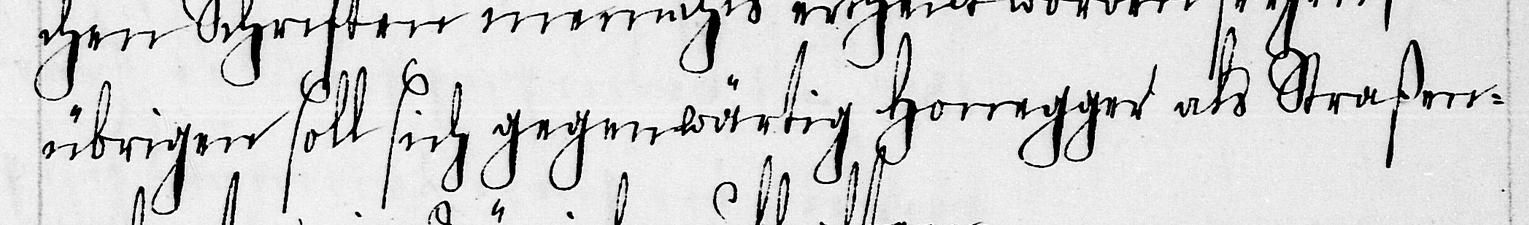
übrigen soll sich gegenwärtig Honegger als Straßen¬
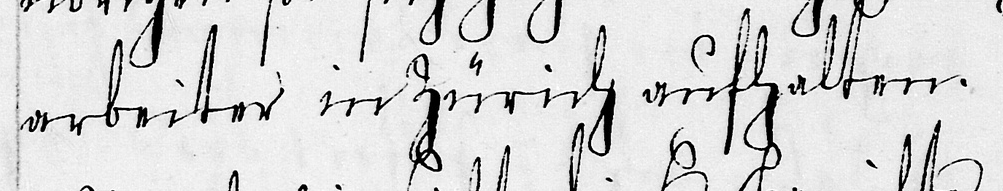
arbeiter in Zürich aufhalten.
